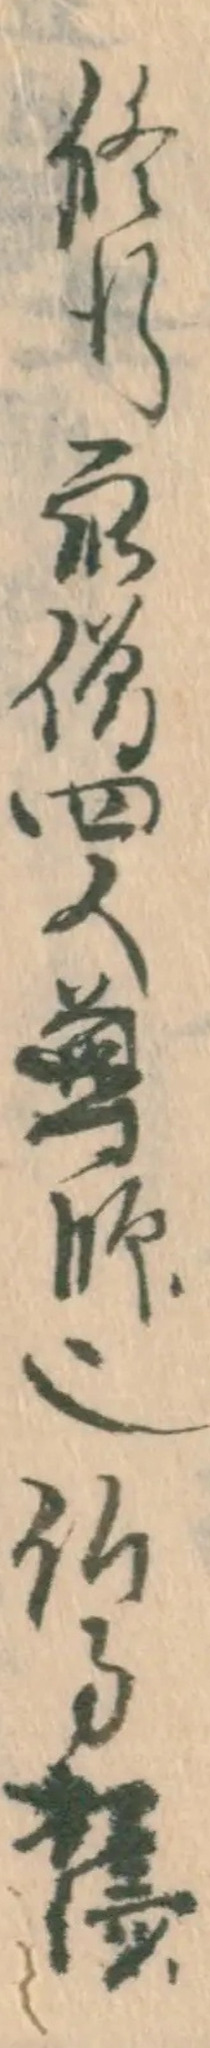修行衆僧四人導師也仏事相済
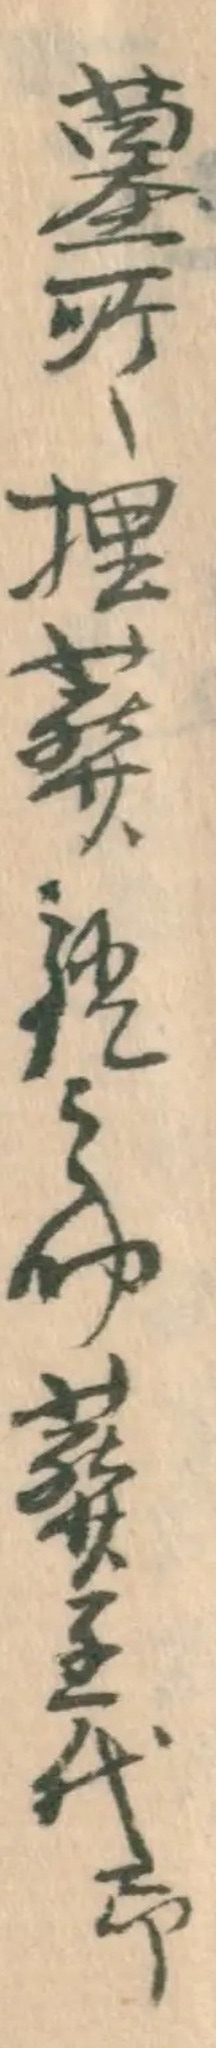墓所へ埋葬鐙之助葬主代予
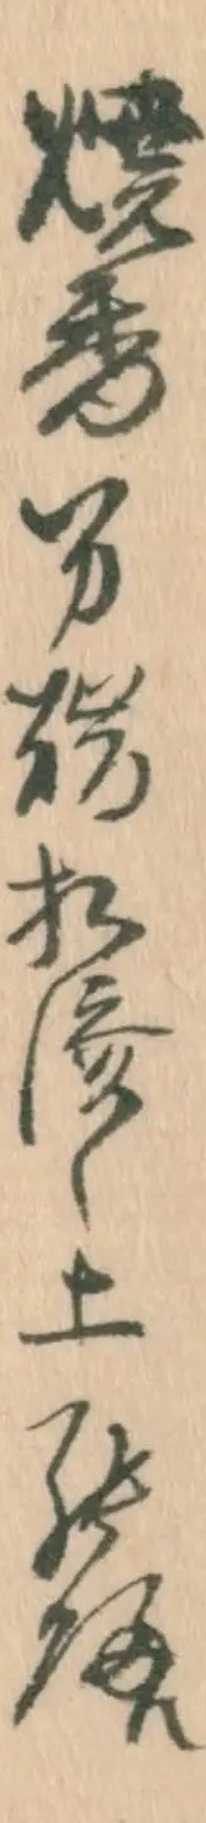焼香万端相済候上罷帰ル
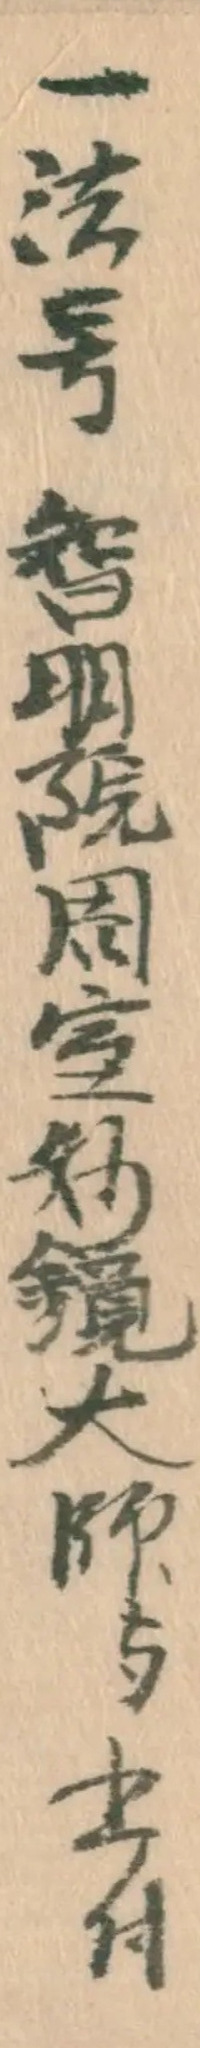一法号智明院周室妙鏡大師と書付
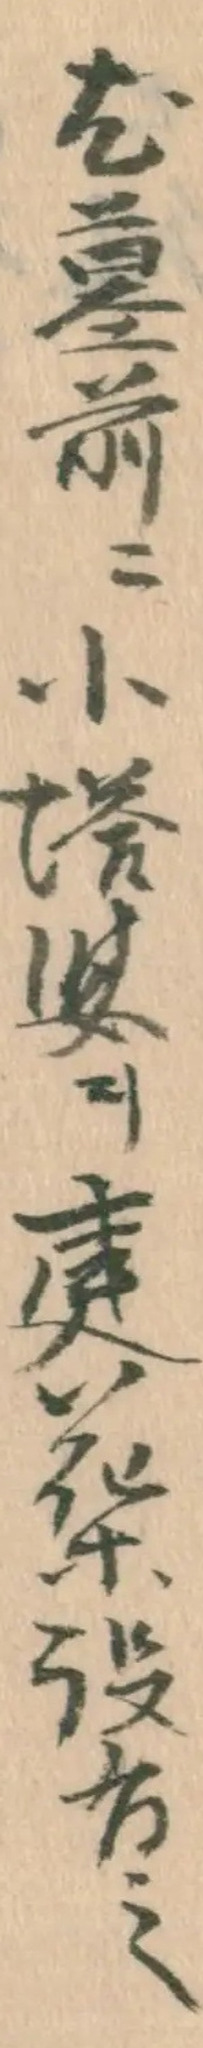尤墓前ニ小塔婆ヲ建花等設有之
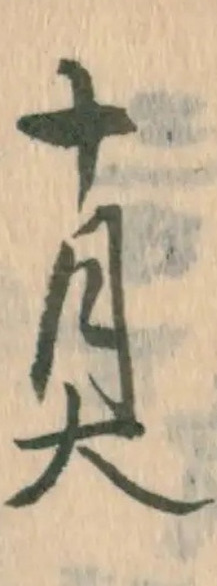十月大
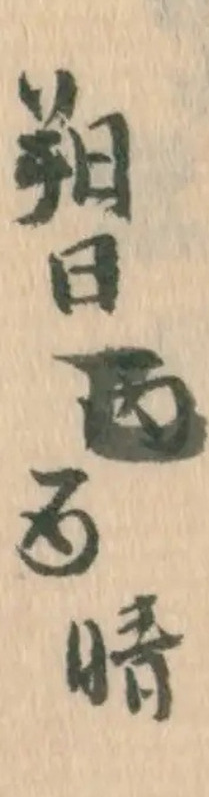朔日乙酉晴
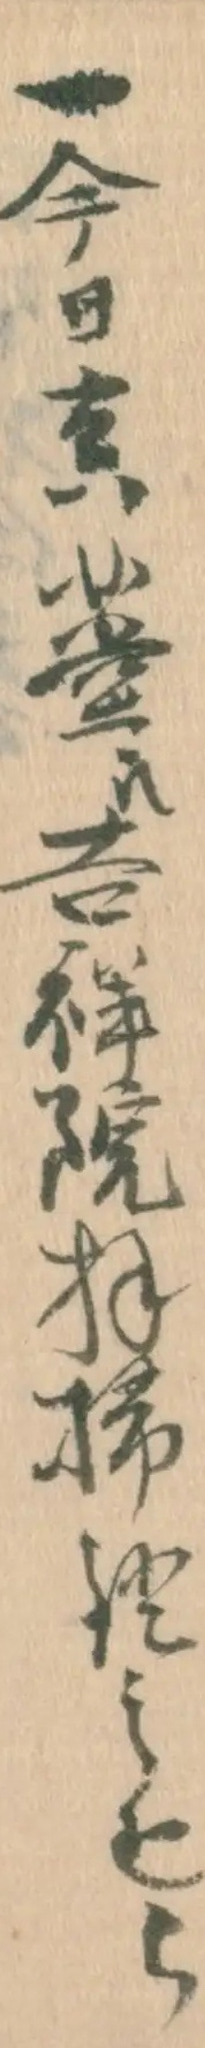一今日真如堂え吉祥院拝掃鐙之進と
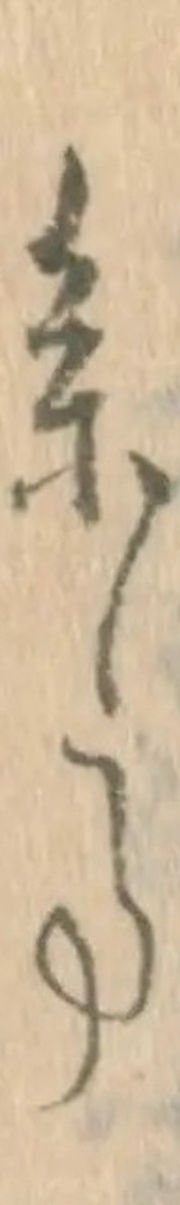参候事
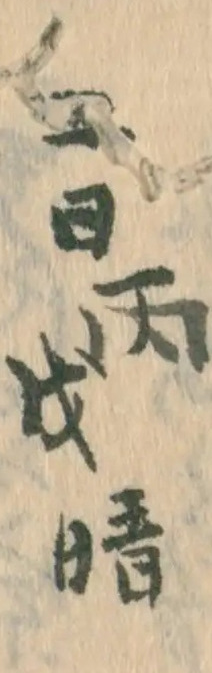二日丙戌晴

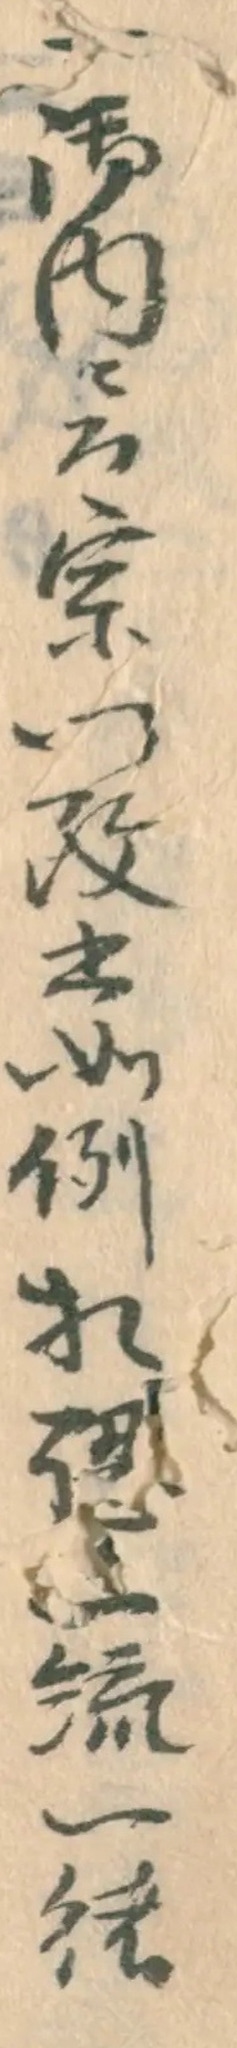一御内ニ而宗門改書如例相認一統一緒
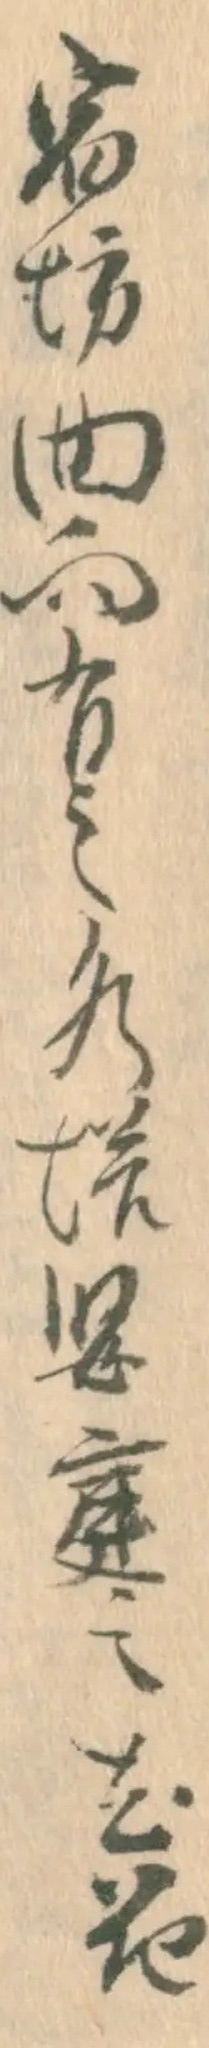宿坊回向有之水塔婆建之尤花
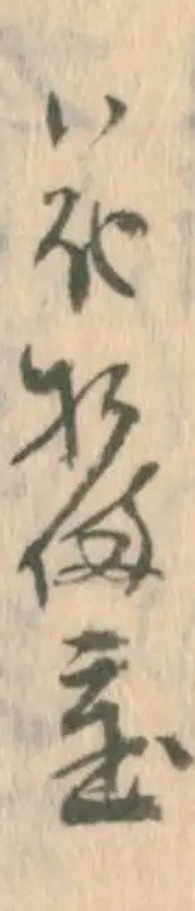花相備置
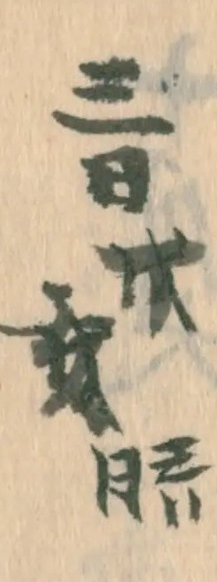三日丁亥晴
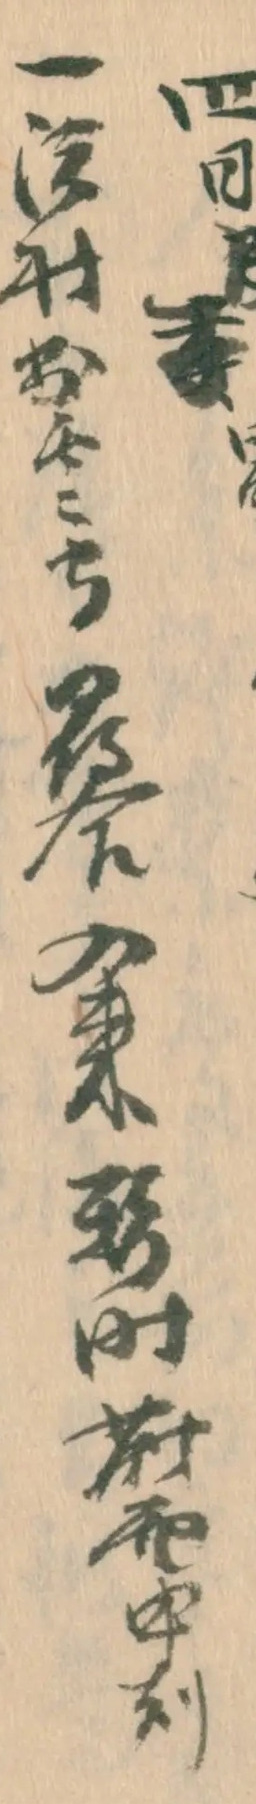一沢村出雲守尋合入来暫時対面申刻
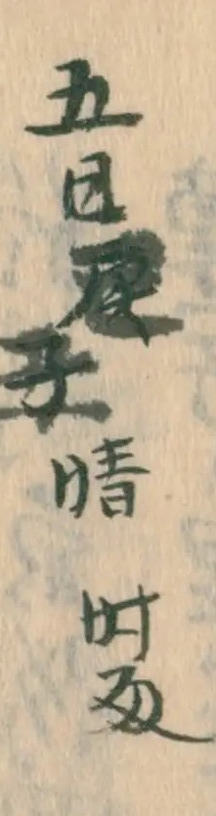五日己丑晴時雨
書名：禁裏御所御用日記. [131]
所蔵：国立国会図書館 National Diet Library, JAPAN
